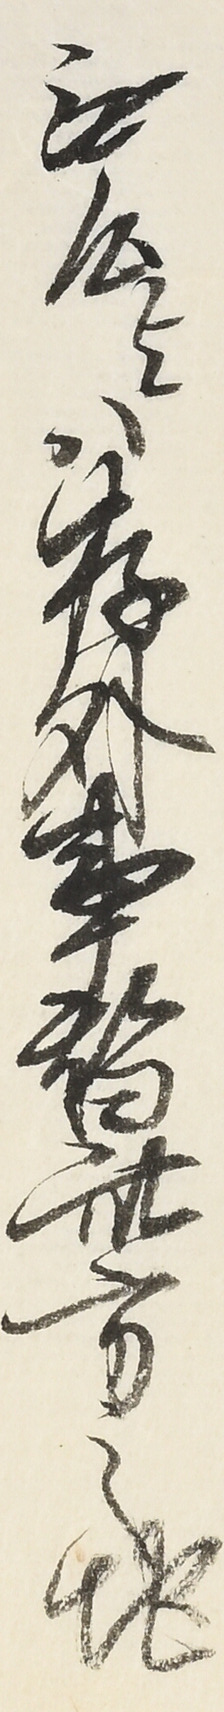無心与ハ存外事替此方之地
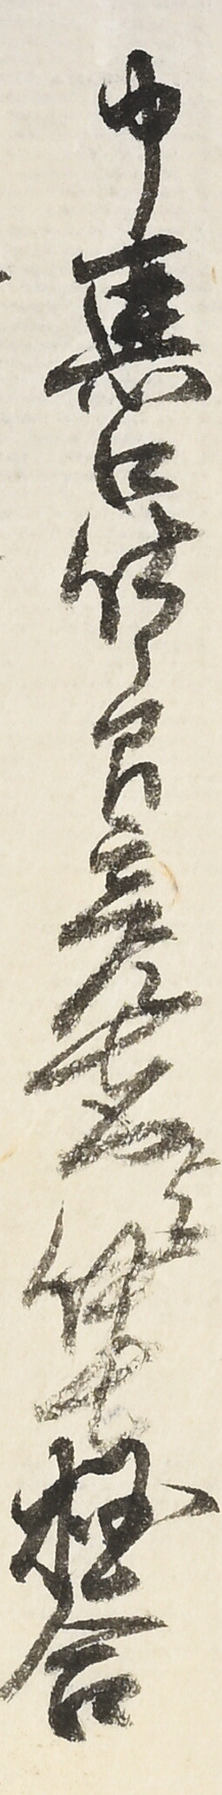申悪口仕候間彦右衛門与伊七掴合
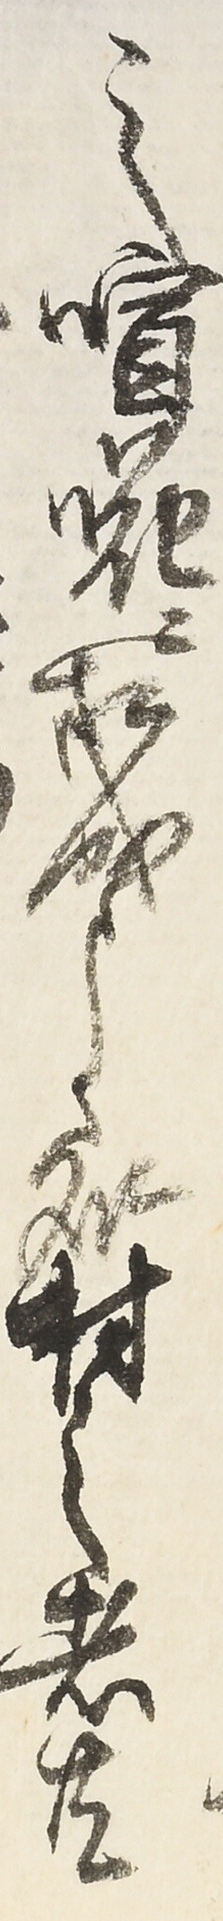之喧嘩ニ相成申候処村之者共
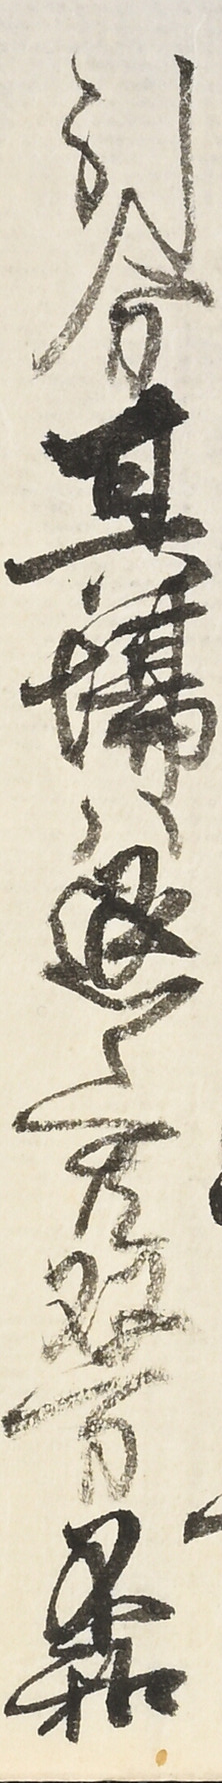引分其場ハ退候へ共双方不和
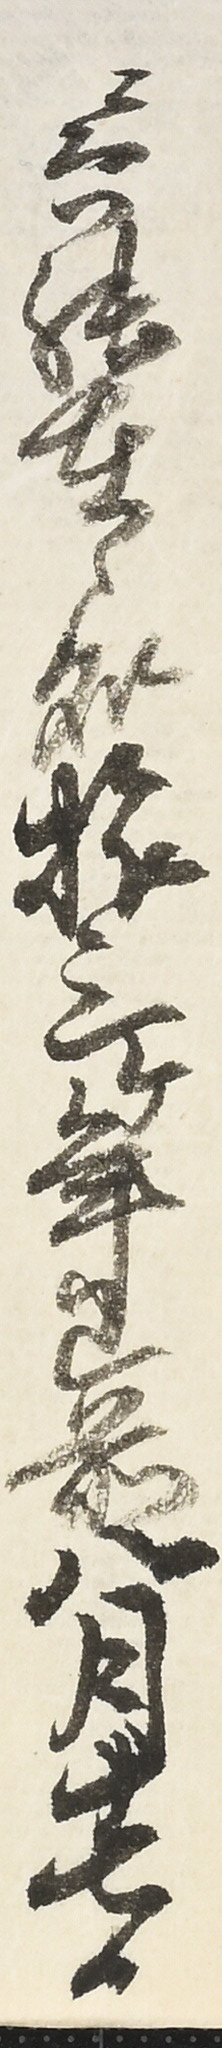ニ而罷在候処拾三ヶ年已前八月十七日
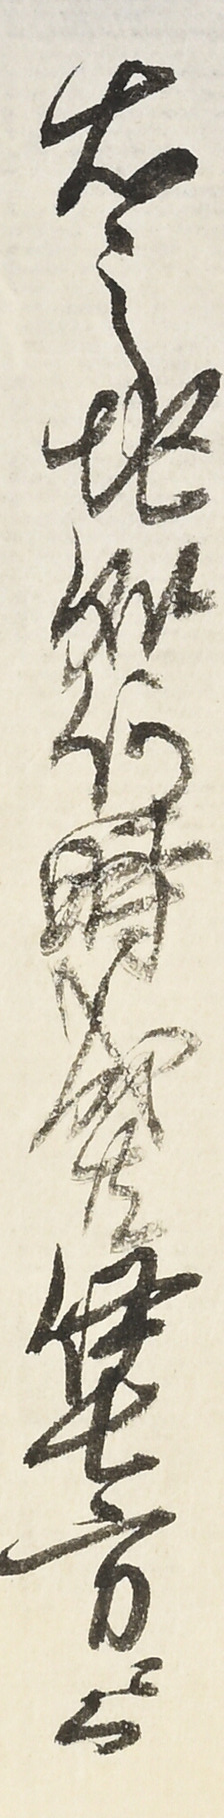右之地処何時成共伊七方ニ而
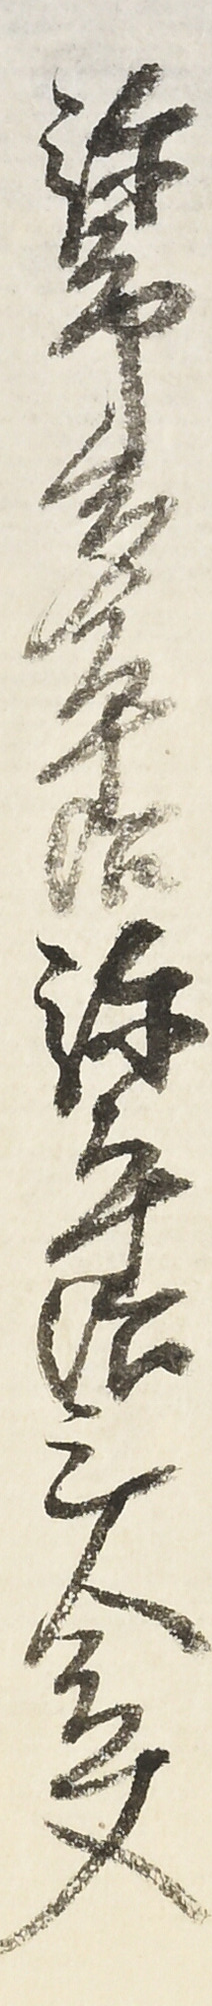弥市多平治弥平治三人立入
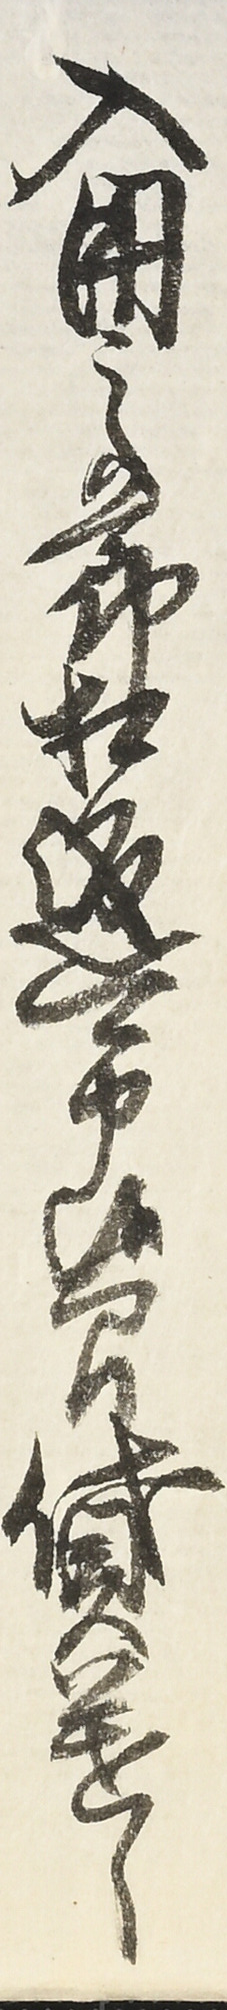入用之節相返可申候間貸入遣し
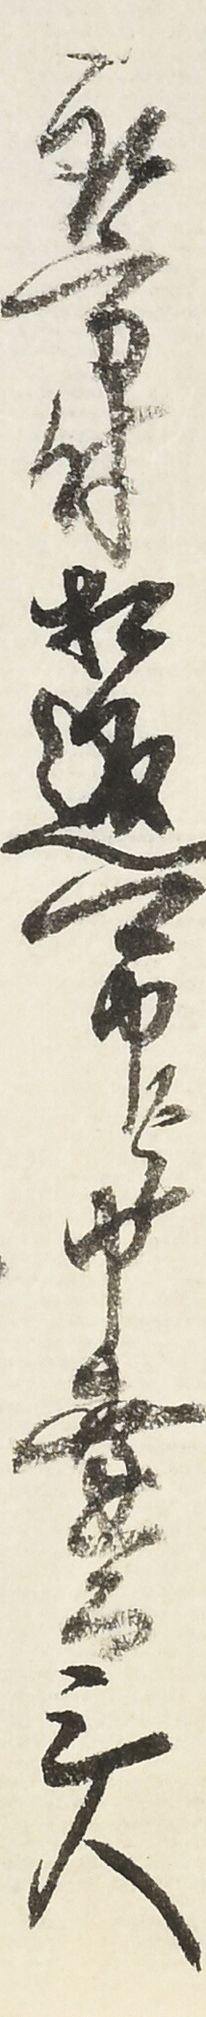取方付相返可申与申達而三人
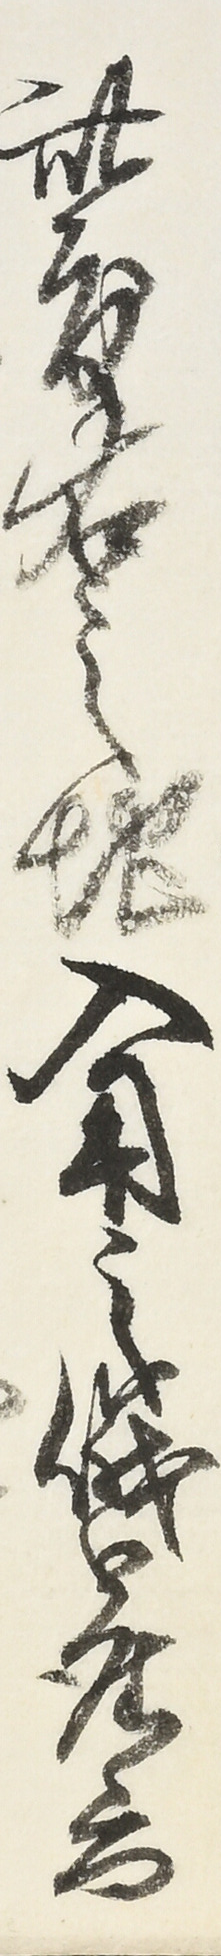此度右之地入用之儀御座候間
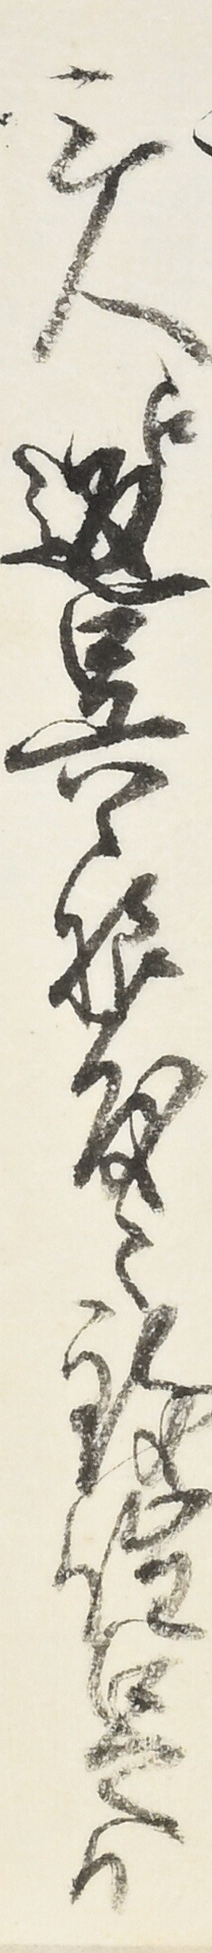三人江返呉候様度々致催足候

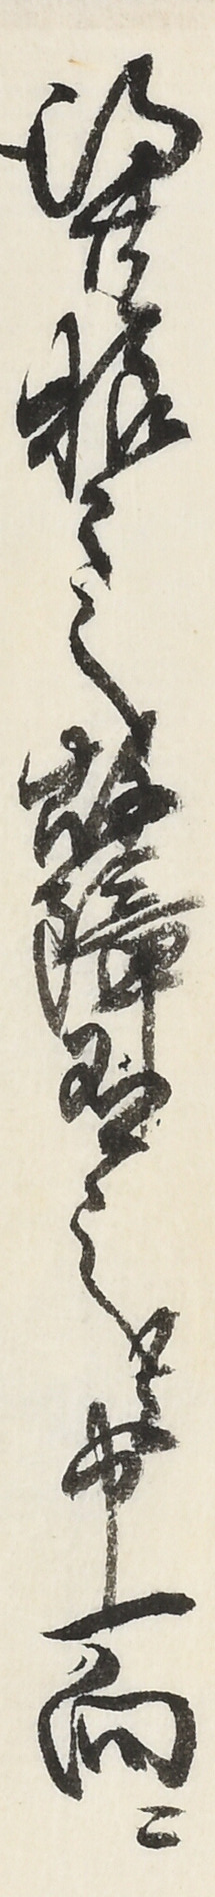得共様々之故障有之与申一向ニ
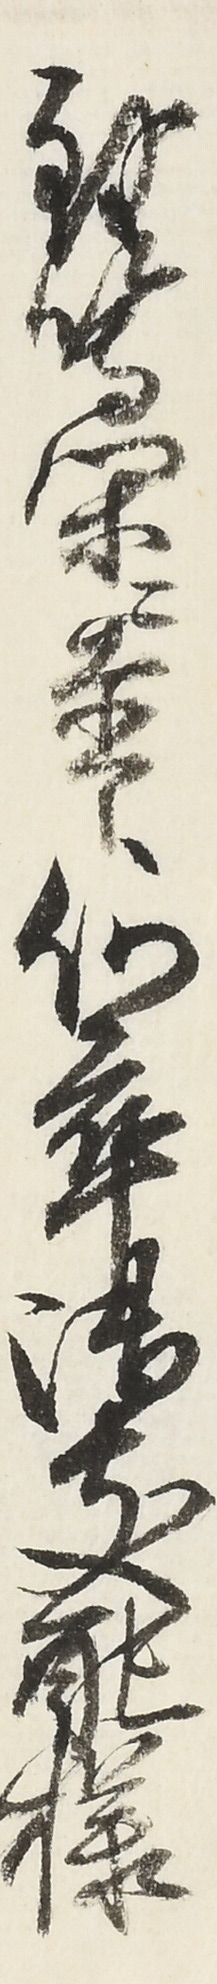致等閑ニ置候何卒御支配様
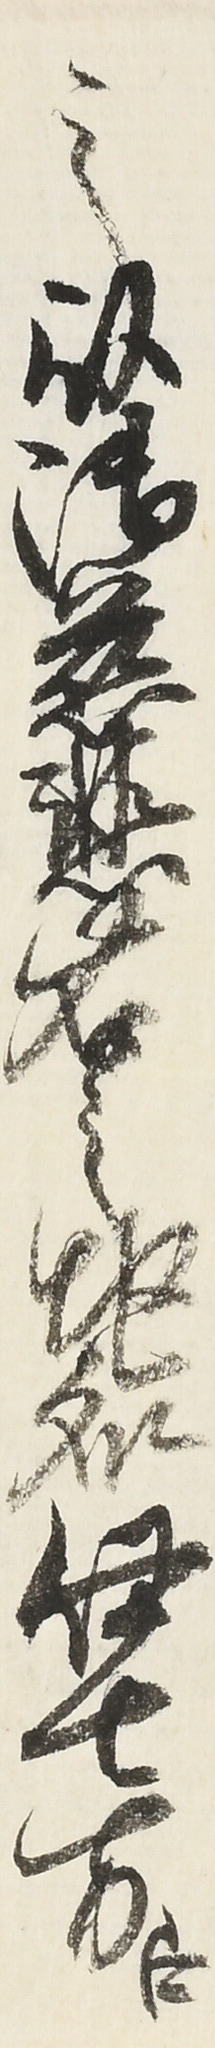之以御慈悲右之地処伊七方江
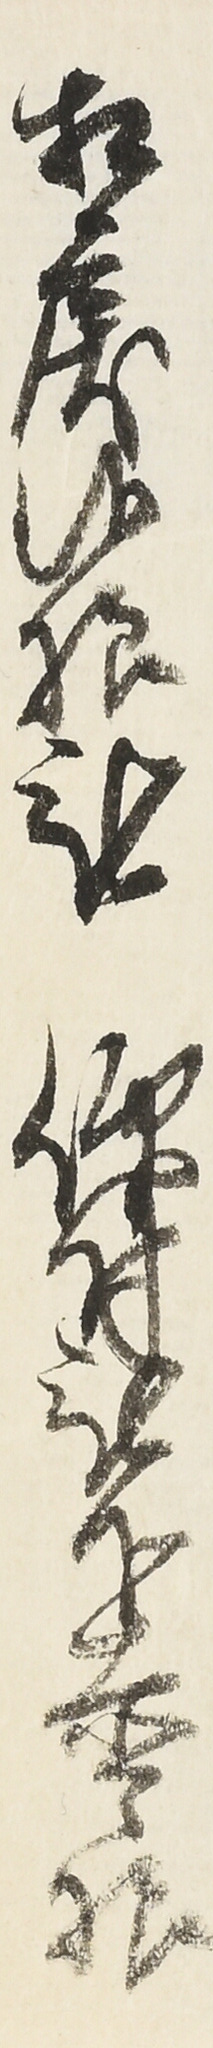相戻候様被仰付被下置候様
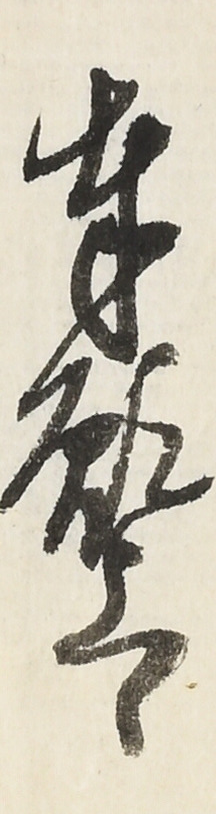奉願上候
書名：乍恐御内々子委奉申上度口上書
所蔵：伊那市立高遠町図書館・合同会社AMANE
